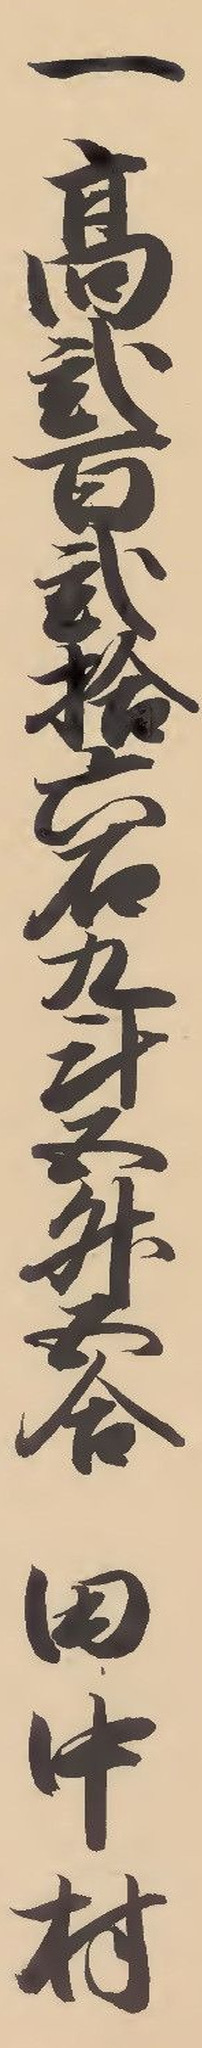一高弐百弐拾六石九斗五升五合田中村
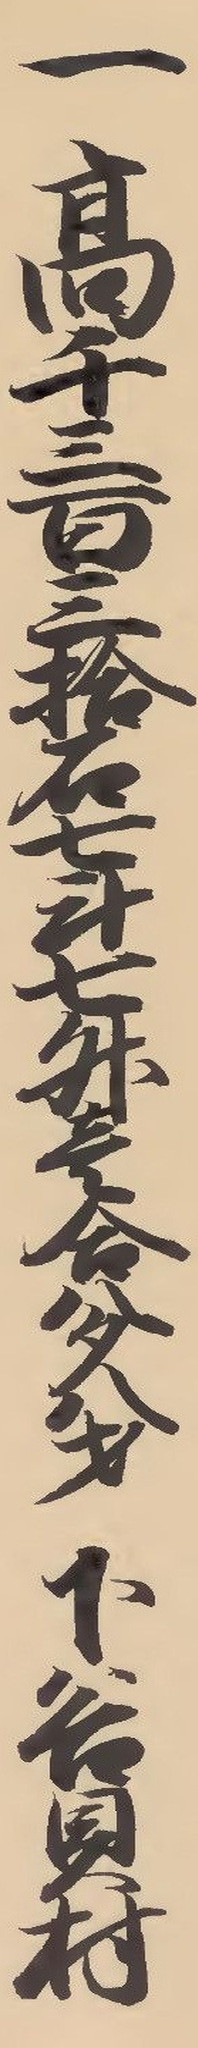一高千三百三拾石七斗七升壱合八勺八才下谷貝村
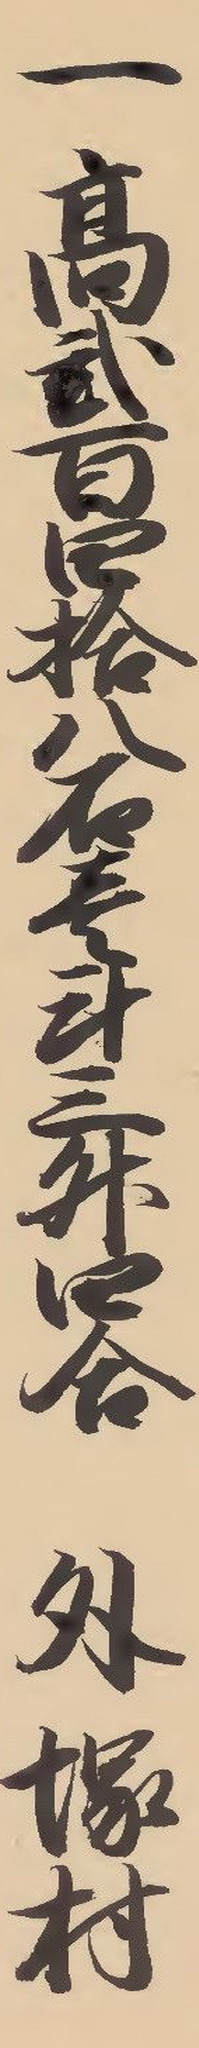一高弐百四拾八石壱斗三升四合外塚村
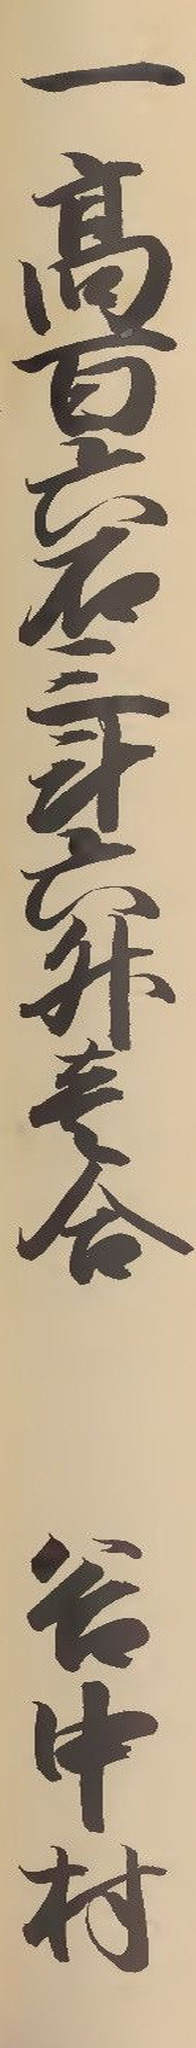一高百六石三斗六升壱合谷中村
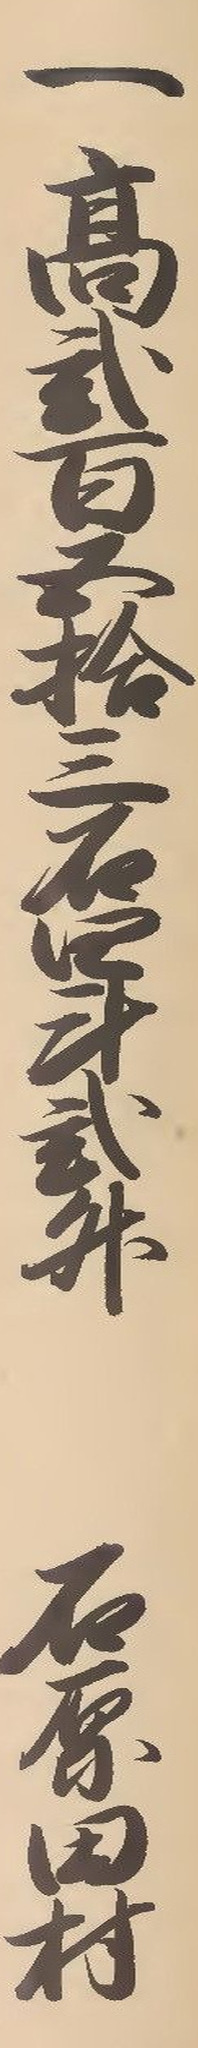一高弐百五拾三石四斗弐升石原田村
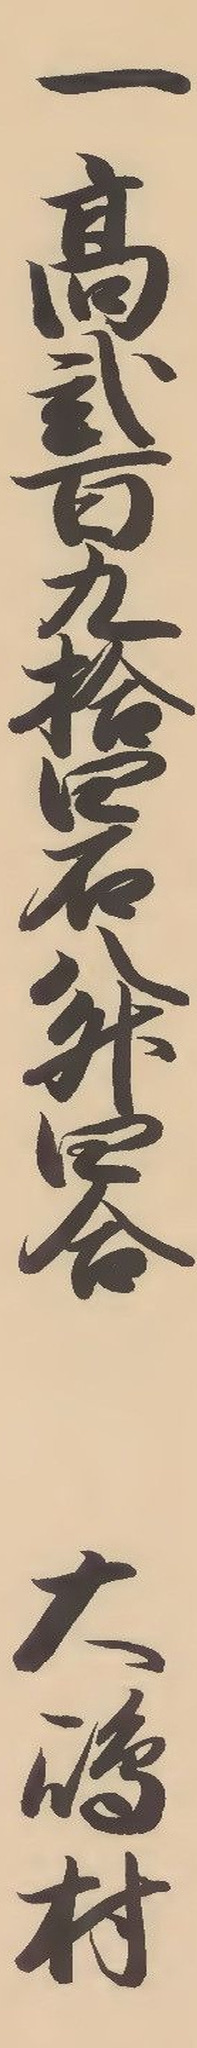一高弐百九拾四石八升四合大島村
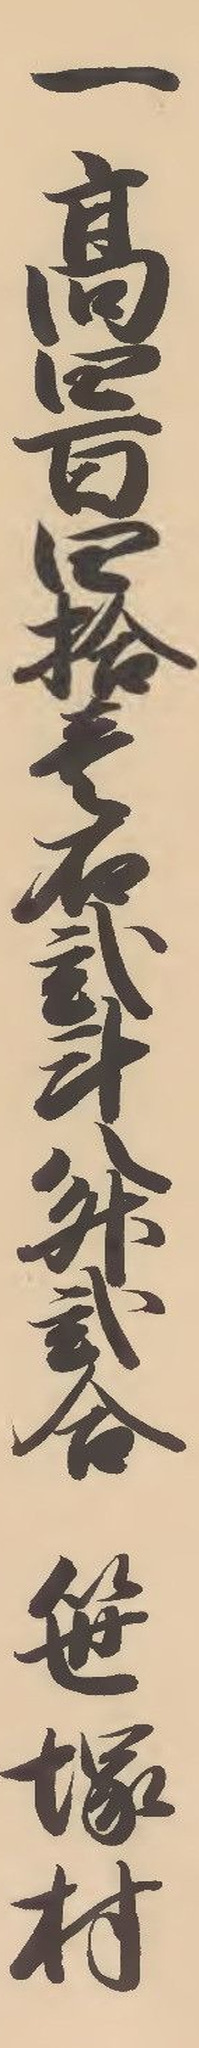一高四百四拾壱石弐斗八升弐合笹塚村
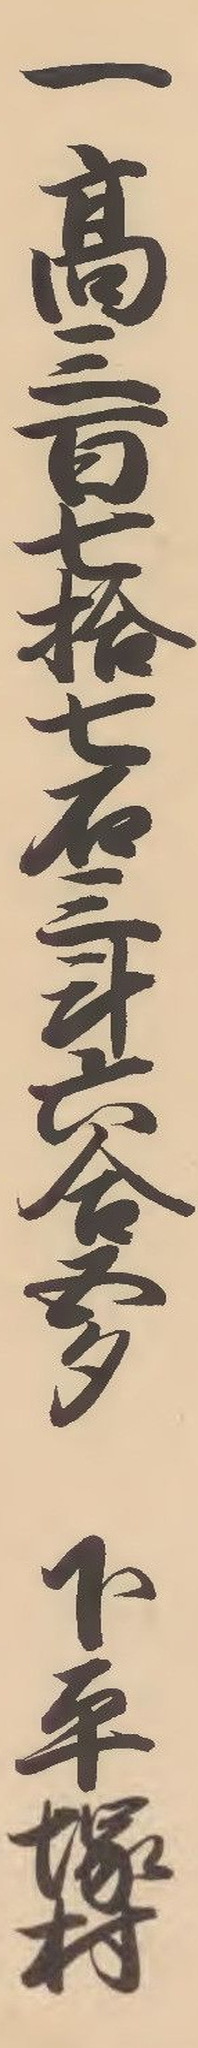一高三百七拾七石三斗六合五勺下平塚村

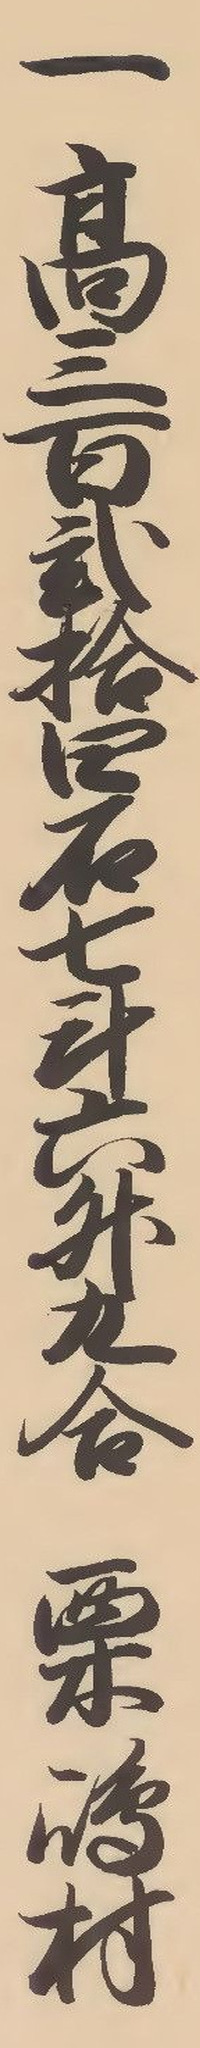一高三百弐拾四石七斗六升九合栗島村
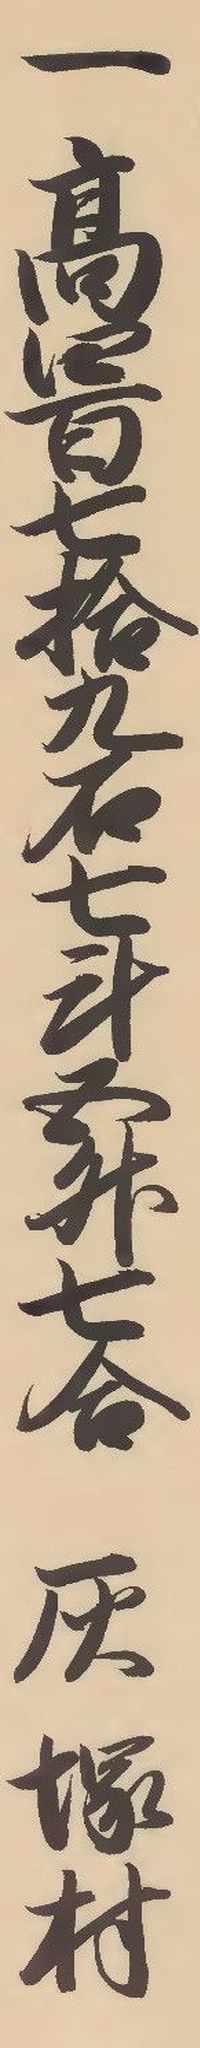一高四百七拾九石七斗五升七合灰塚村
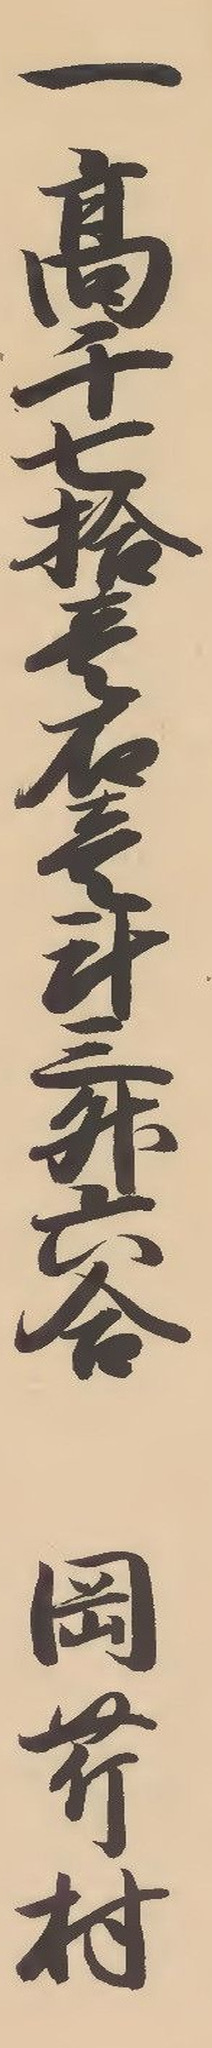一高千七拾壱石壱斗三升六合岡芹村
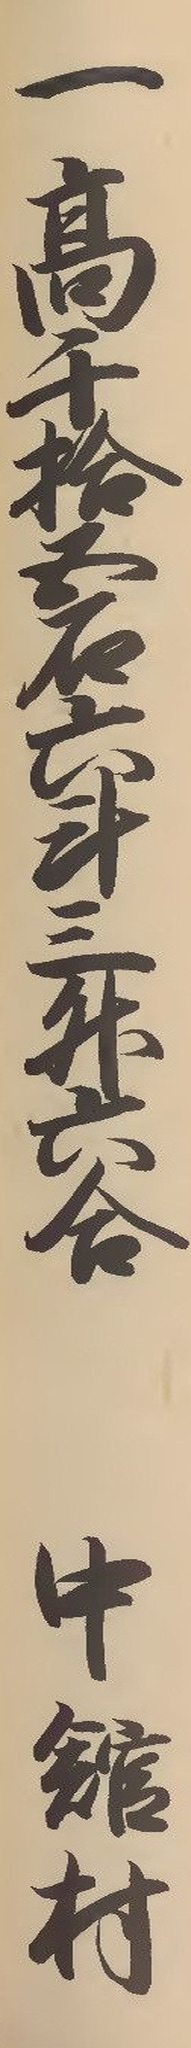一高千拾五石六斗三升六合中館村
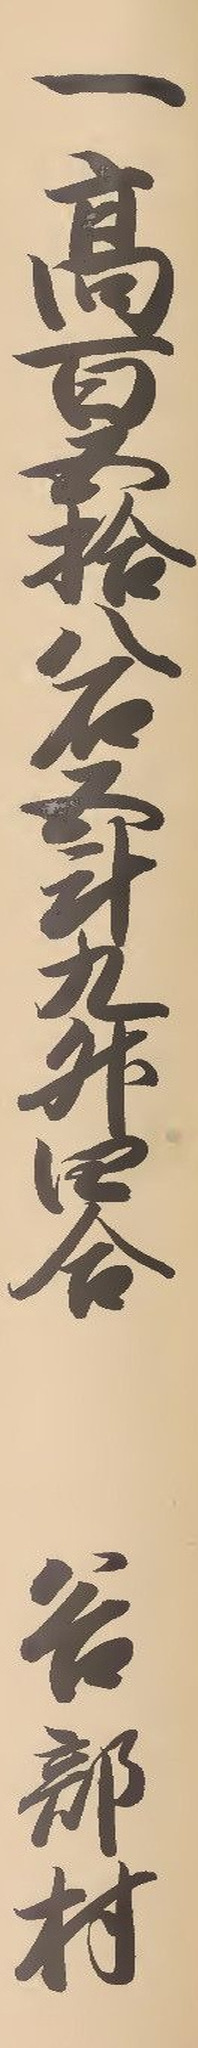一高百五拾八石五斗九升四合谷部村
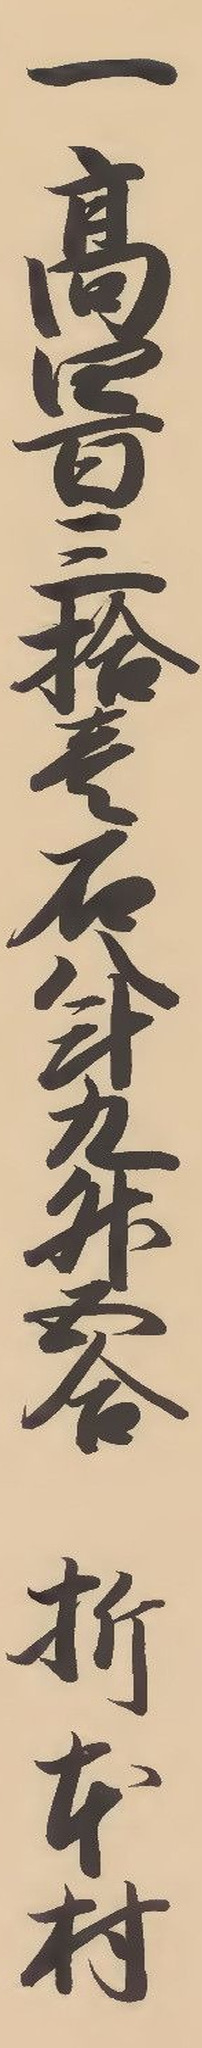一高四百三拾壱石八斗九升五合折本村
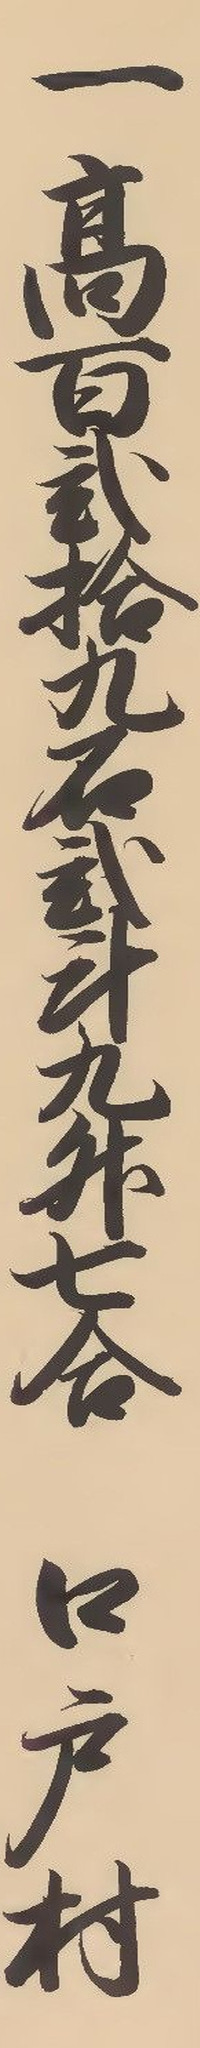一高百弐拾九石弐斗九升七合口戸村

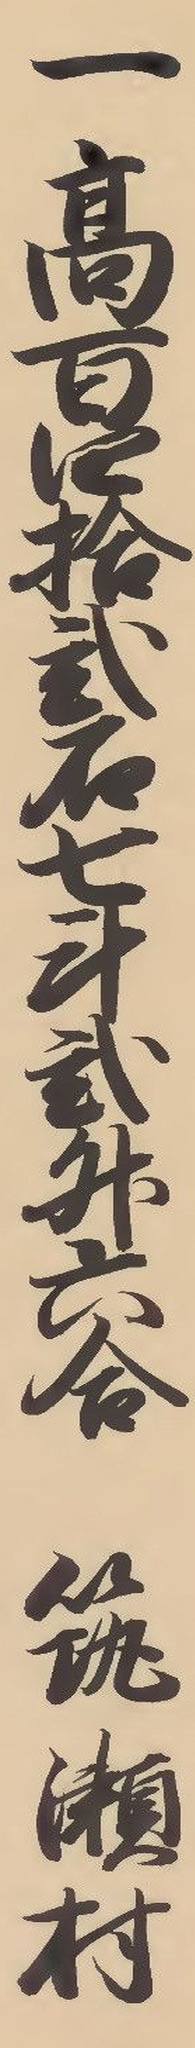一高百四拾弐石七斗弐升六合筑瀬村
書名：常陸国郷帳
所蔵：国立公文書館 National Archives of Japan
